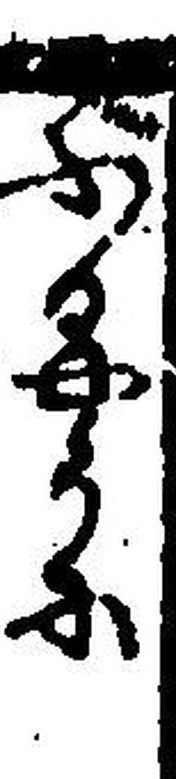ふるやうに
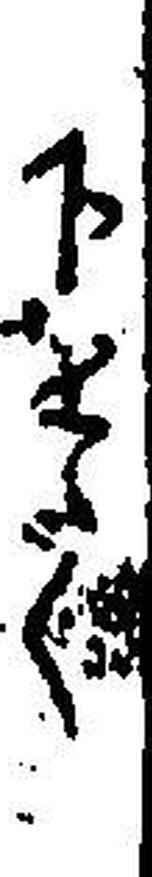下をたく
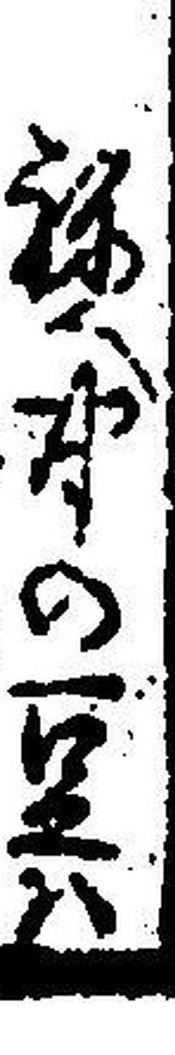ねへ中の一足は
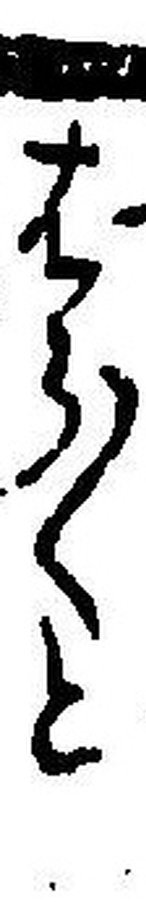はら〳〵と
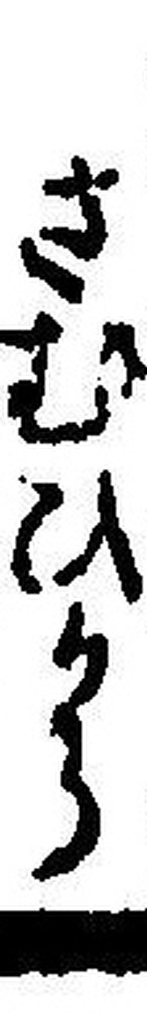さむひから
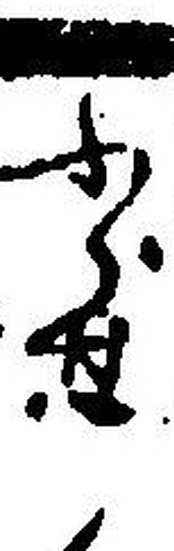ふらせ
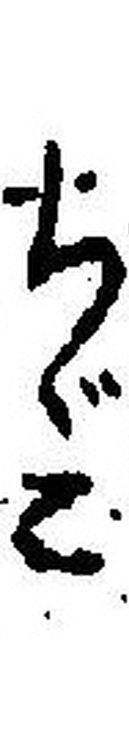ちゞこ
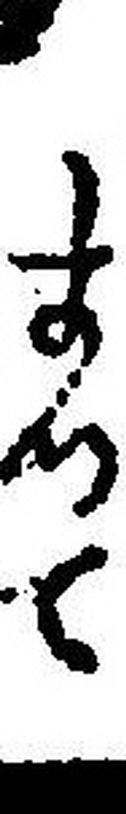まつて
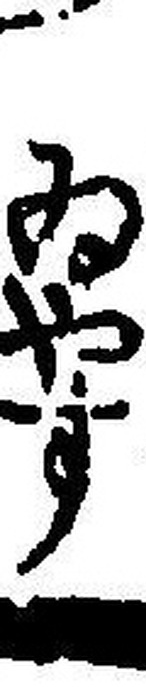ゐやす
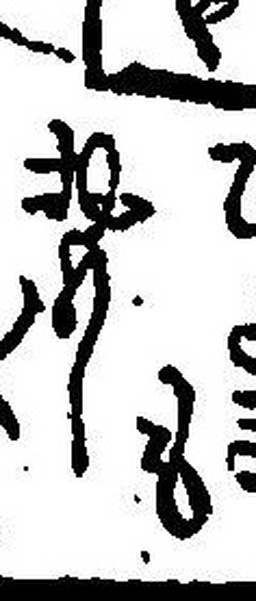おもし
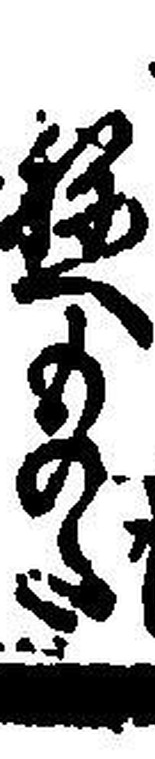ねへものた
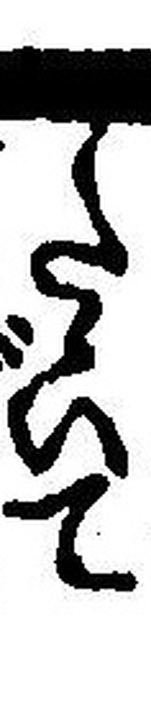たゝいて
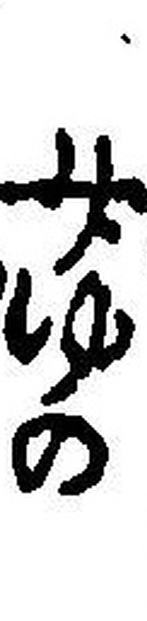女ゆの
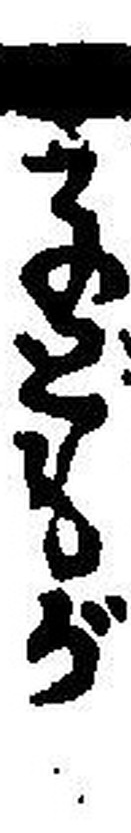子どもが
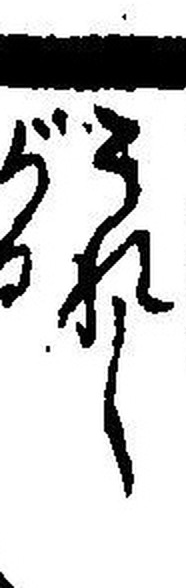うれし
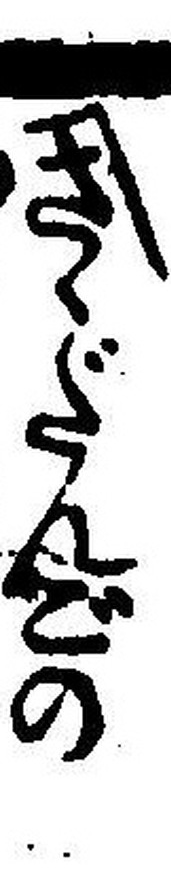〽さゝだんごの
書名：徳若水縁起金性 / 樹下石上作
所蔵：東京大学総合図書館 General Library in the University of Tokyo, JAPAN
